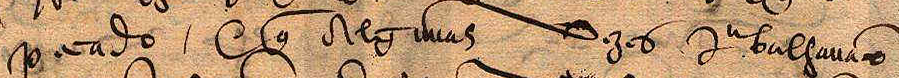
pecado / e q̄ Alguūas vezes tabalhauão
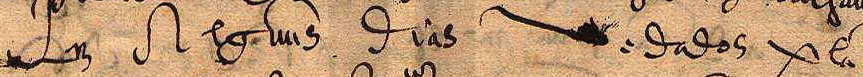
em Algūus dias vedados pl̄a
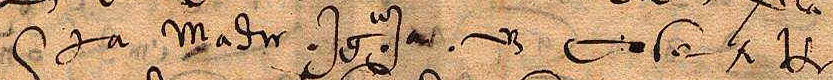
Sta madre JḡJa em casa e Re
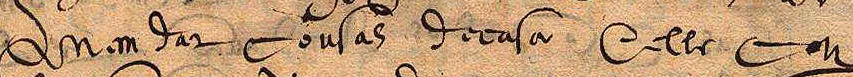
mendar cousas de casa e elle con
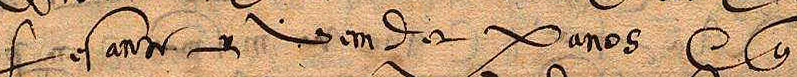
fesante em vemder panos e q̄
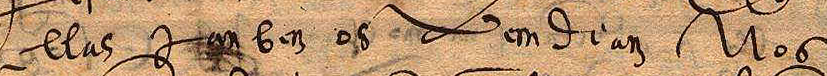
ellas tambem os vemdiam Nos
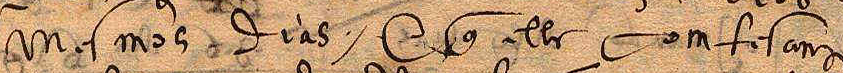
mesmos dias ./ e q̄ elle comfesante
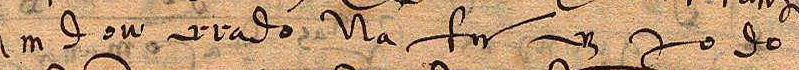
Amdou errado Na fee em todo
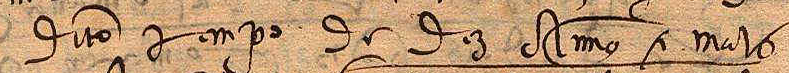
o dīto tempo de dez An̄nꝯ e majs
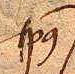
tpꝯ̄
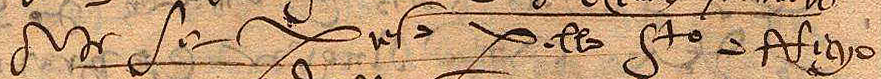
Ate ser preso pello Sto officyo
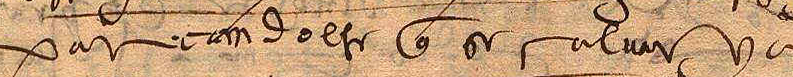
parecemdolhe q̄ se saluarya
